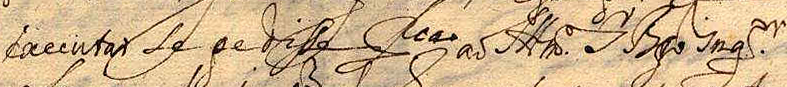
executar se pedisse L.ca ao Illm.o Sor Bpō inq.or
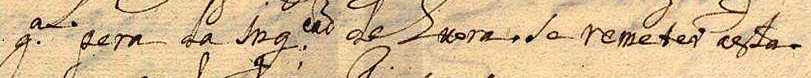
g.al pera da Inq.cão de Euora se remeter a esta
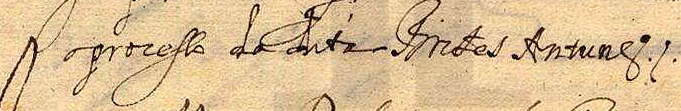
o processo da dita Brites Antunes ./.
